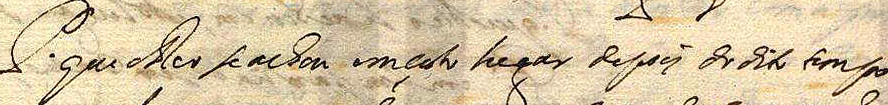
P. que o Reo se achou em certo lugar depois do dito tempo
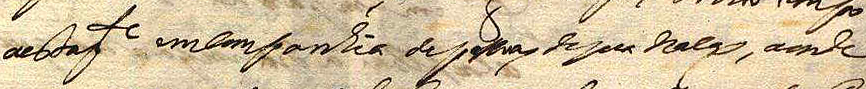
a esta pt.e em companhia de pessoas de sua naçaõ, aonde
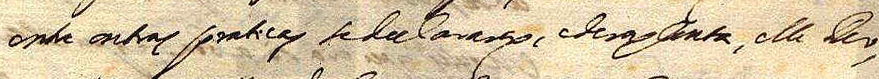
entre outras praticas se declararaõ, e deraõ conta, elle Reo,
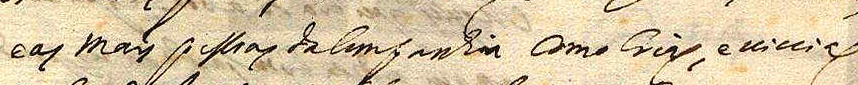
e as mais pessoas da companhia como Criaõ, e uiuiaõ
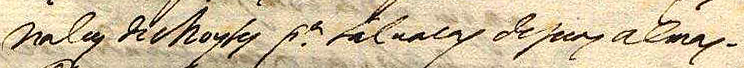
na ley de Moyses p.a saluaçaõ de suas almas.
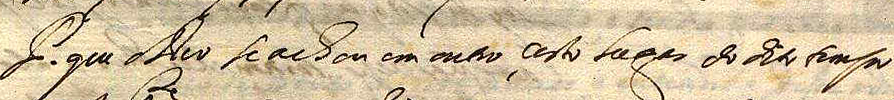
P. que o Reo se achou em outro certo lugar do dito tempo
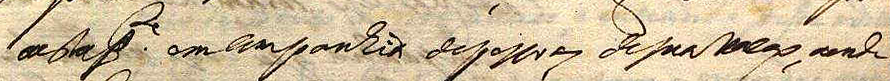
a esta p.te em companhia de pessoas de sua naçaõ, aonde
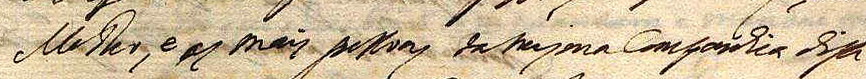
elle Reo, e as mais pessoas da mesma Companhia disse
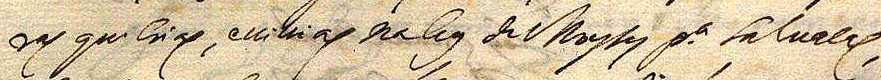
raõ que criaõ, e uiuiaõ na ley de Moyses p.a saluaçaõ,
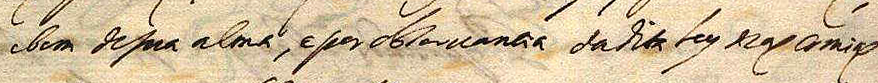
e bem de sua alma, e por obseruancia da dita ley naõ comiaõ
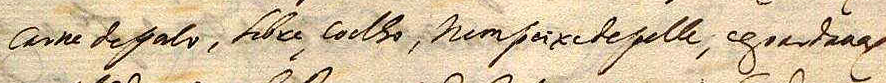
carne de porco, lebre, coelho, nem peixe de pelle, e goardauaõ
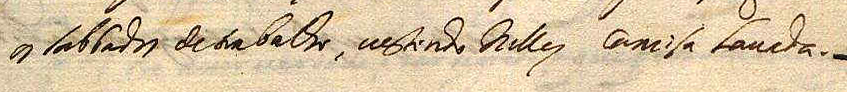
os sabbados de trabalho, uestindo nelles camisa lauada.
